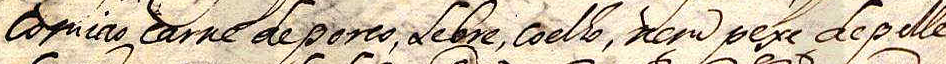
comiaõ carne de porco, Lebre, coelho, nem pexe de pelle,
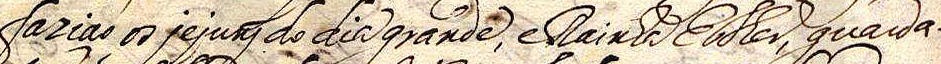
faziaõ os jejuns do dia grande, e Rainha Esther, guarda
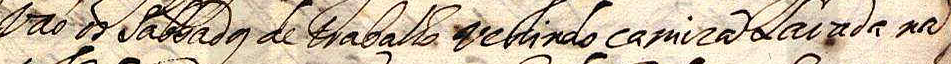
vaõ os sabbados de trabalho vestindo camiza Lavada na
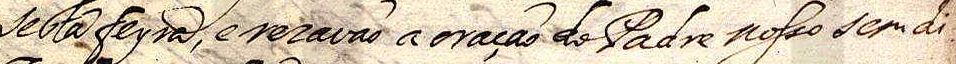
sesta feyra, e rezavaõ a oração do Padre nosso sem di
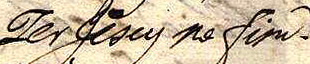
Zer Jesus no fim.
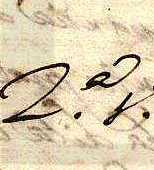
2.a t.a
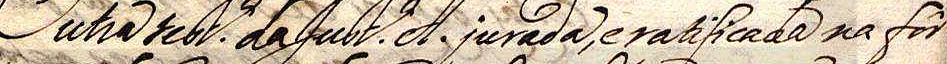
Outra test.a da Just.a A. jurada, e ratificada na fôr
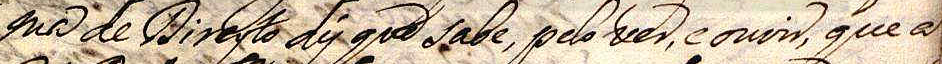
ma de Direyto dis que sabe, pelo ver, e ouvir, que a
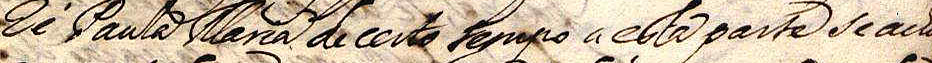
Ré Paula Maria de certo tempo a esta parte se acho
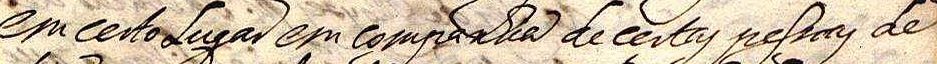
em certo Lugar em companhia de certas pessoas de
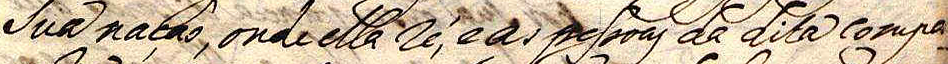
sua naçaõ, onde ella Ré, e as pessoas da dita compa
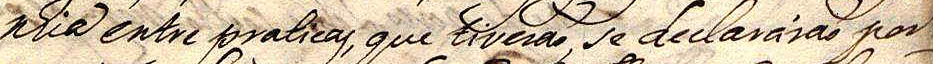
nhia entre praticas, que tiveraõ, se declararaõ por
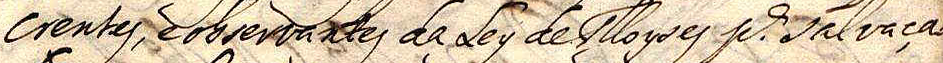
crentes, e observantes da Ley de Moyses p.a salvaçaõ
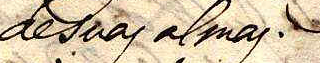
de suas almas.
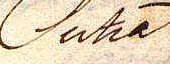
Outra
